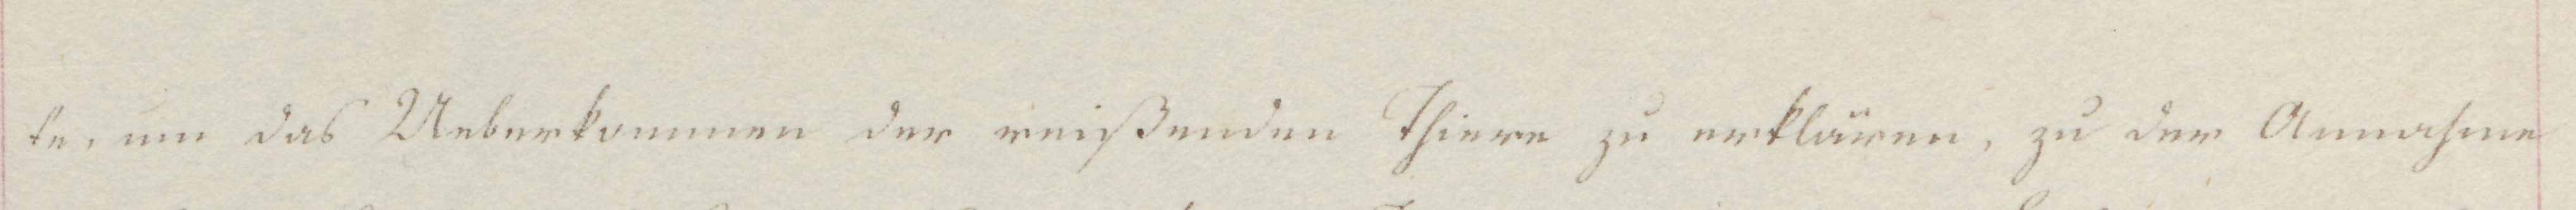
te, um das Ueberkommen der reißenden Thiere zu erklären, zu der Annahme
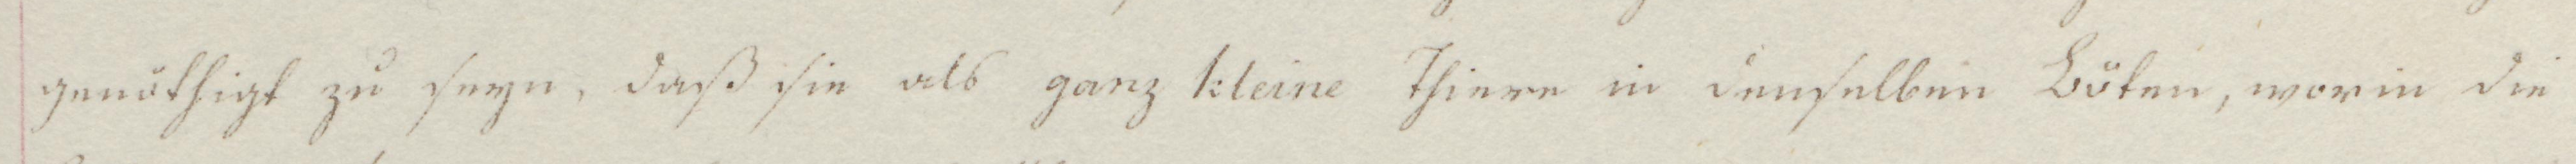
genöthigt zu seyn, daß sie als ganz kleine Thiere in denselben Böten, worin die
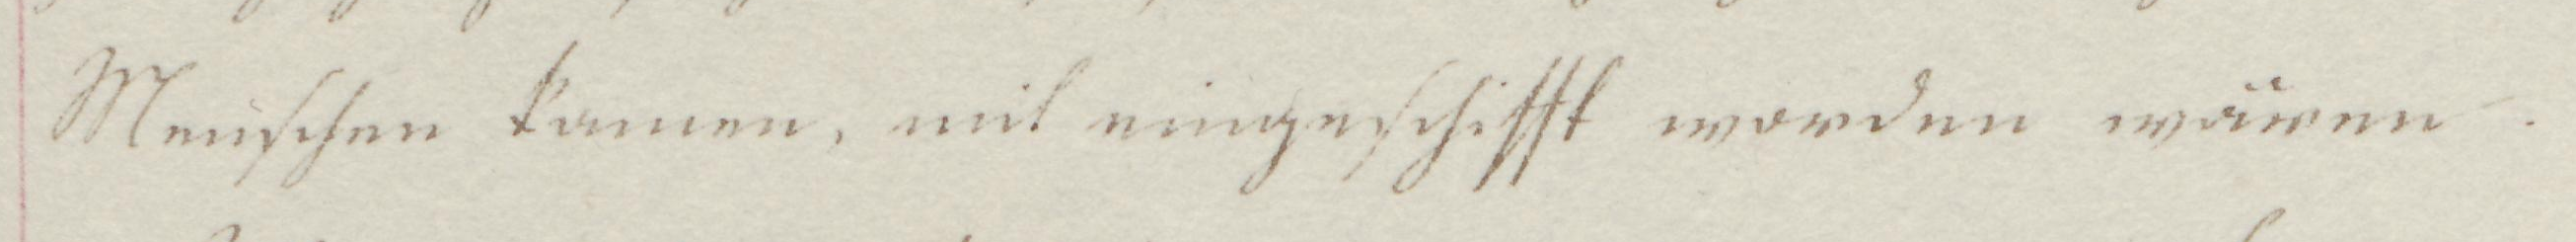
Menschen kamen, mit eingeschifft worden wären.
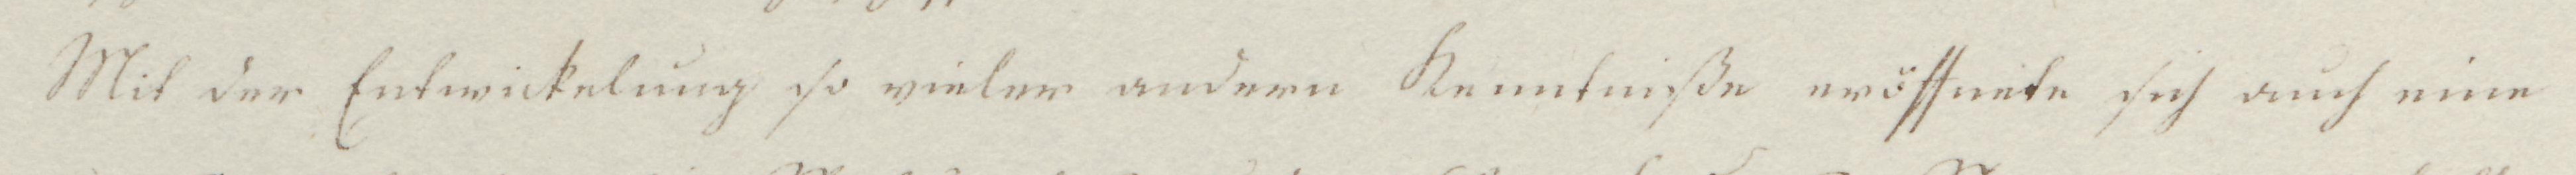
Mit der Entwickelung so vieler Kenntniße eröffnete sich auch eine
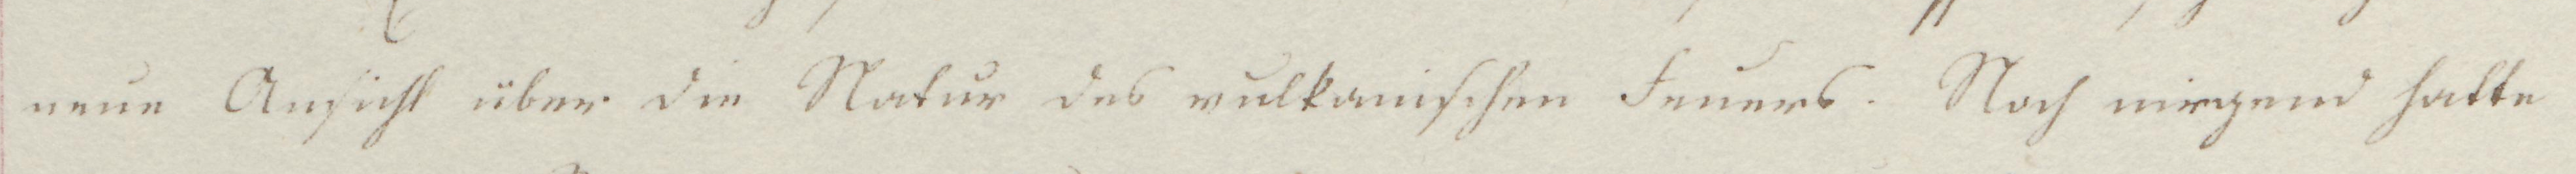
neue Ansicht über die Natur des vulkanischen Feuers. Noch nirgend hatte
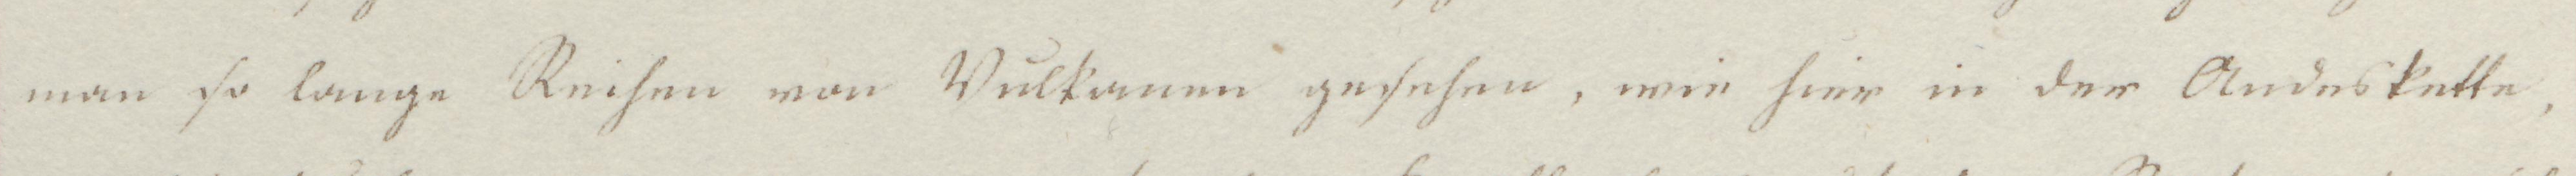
man so lange Reihen von Vulkanen gesehen, wie hier in der Andeskette,
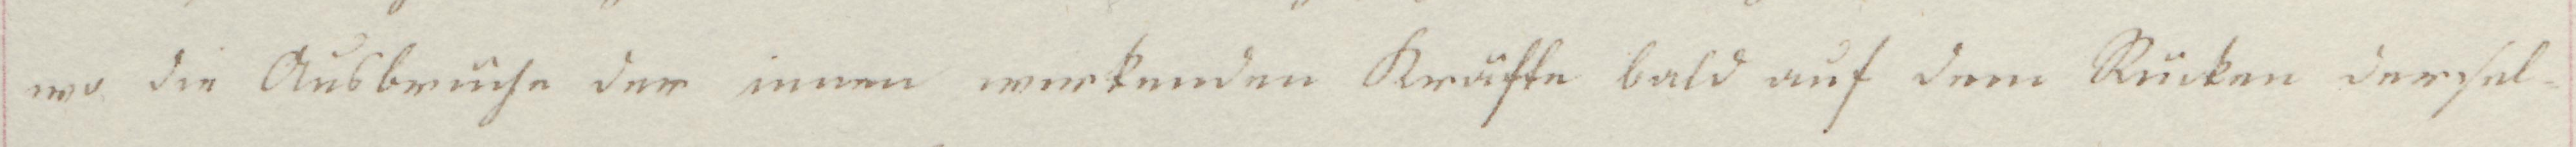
wo die Ausbrüche der innen wirkenden Kräfte bald auf dem Rücken dersel-
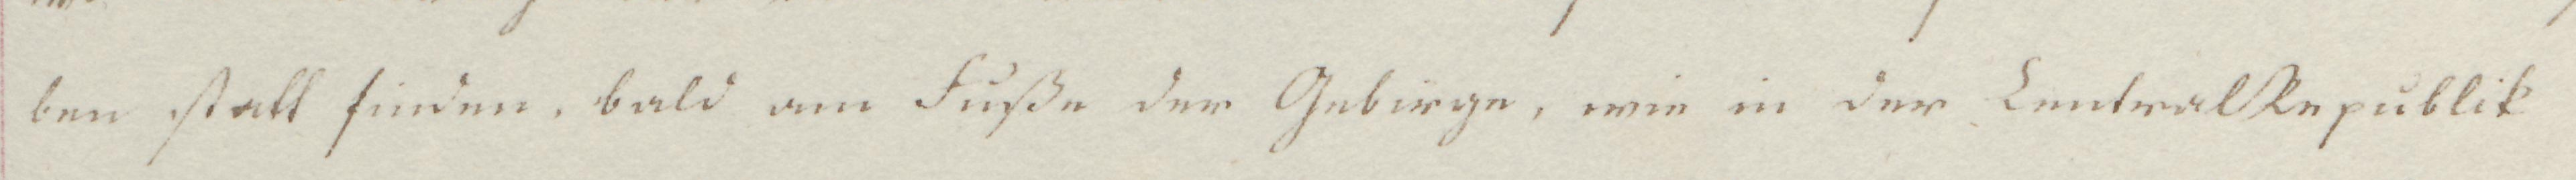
ben statt finden, bald am Fuße der Gebirge, wie in der CentralRepublik
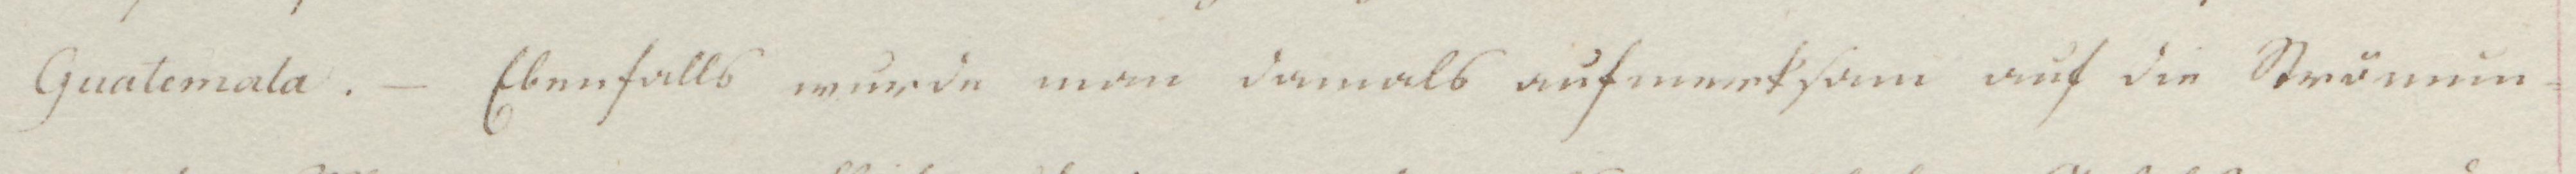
Guatemala. – Ebenfalls wurde man damals aufmerksam auf die Strömun-
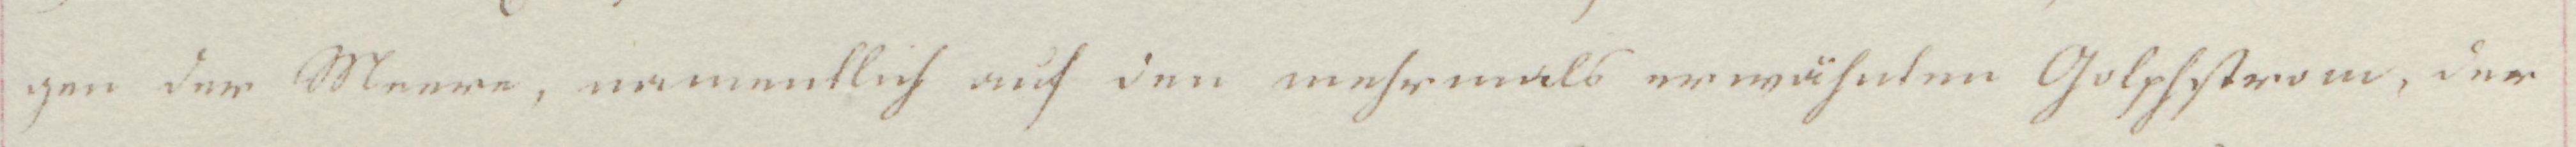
gen der Meere, namentlich auf den mehrmals erwähnten Golphstrom, der
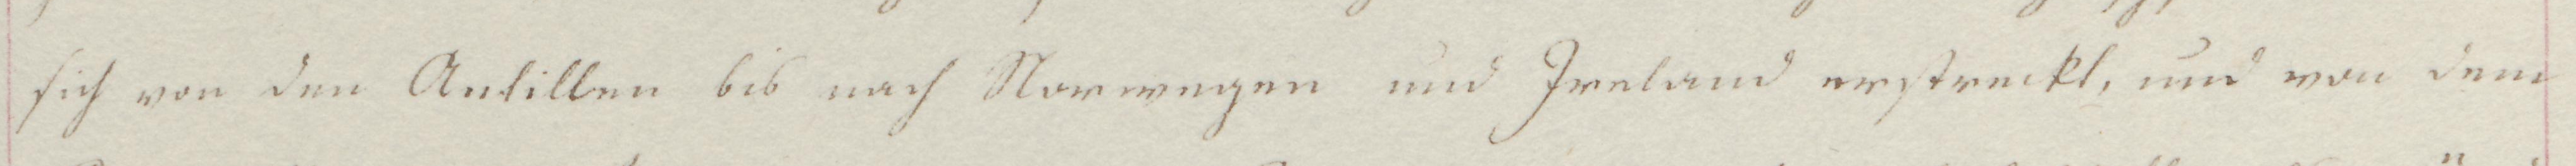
sich von den Antillen bis nach Norwegen und Ireland erstreckt, und von dem
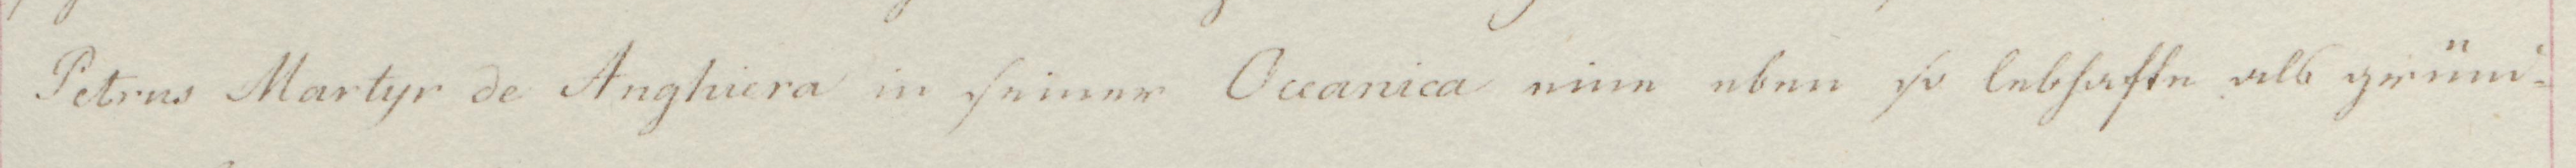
Petrus Martyr de Anghiera in seiner Oceanica eine eben so lebhafte als gründ-
